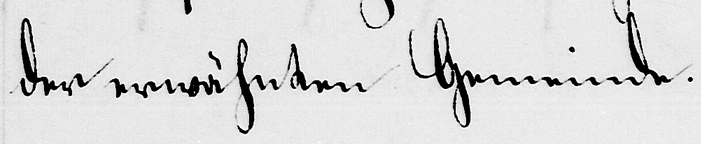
der erwähnten Gemeinde.
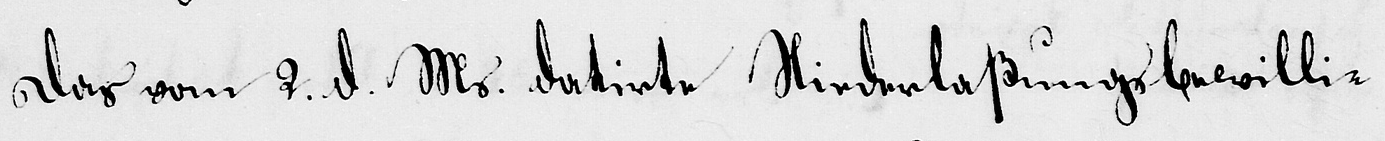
Das vom 2. d. Ms. datirte Niederlaßungsbewilli¬
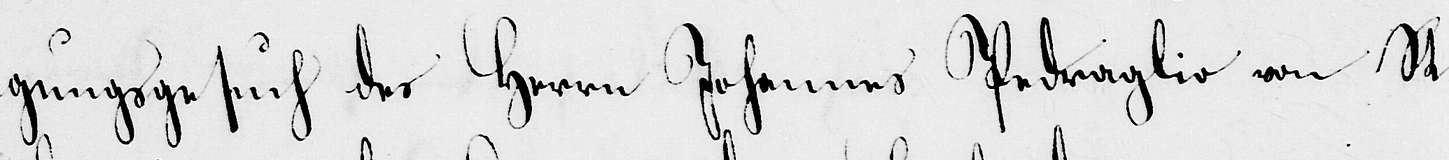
ungsgesuch des Herrn Johannes Pedraglio von St.
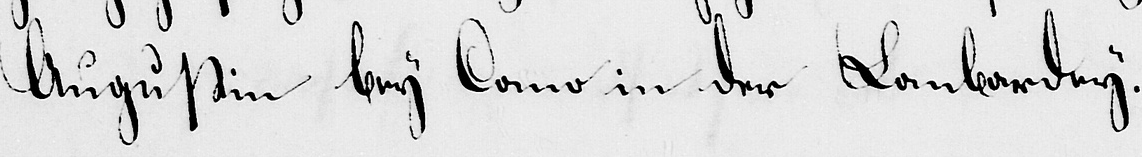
Augustin bey Como in der Lombardey.
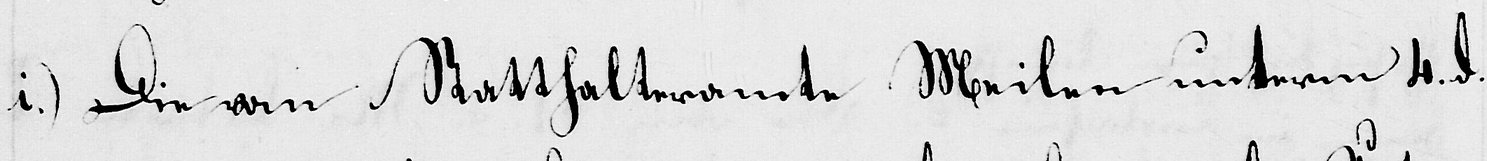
i.) Die vom Statthalteramte Meilen unterm 4. d.
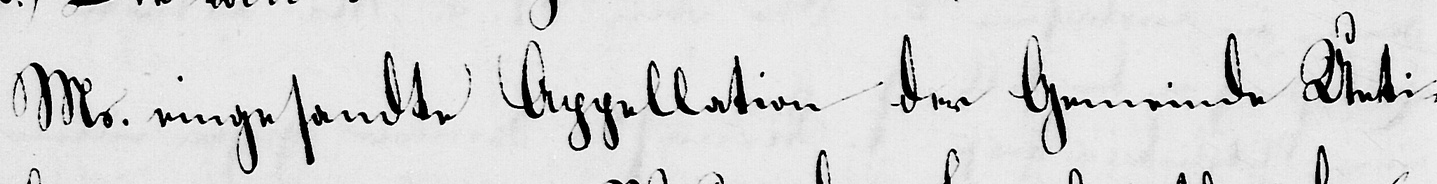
Ms. eingesandte Appellation der Gemeinde Ueti¬
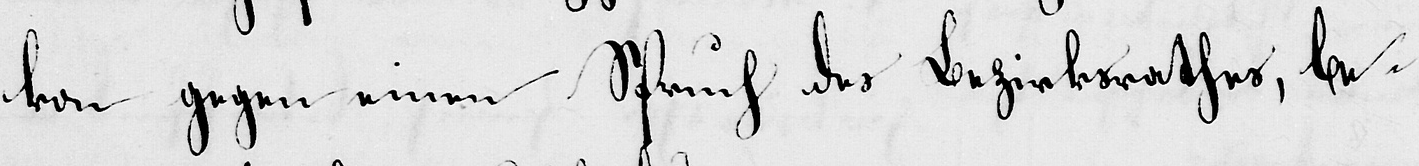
kon gegen einen Spruch des Bezirksrathes, be¬
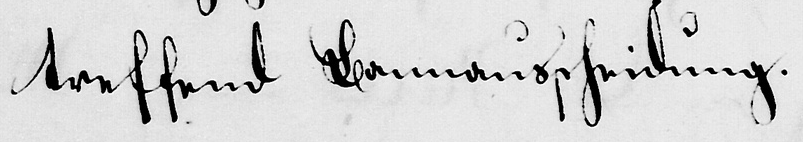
treffend Bannausscheidung.
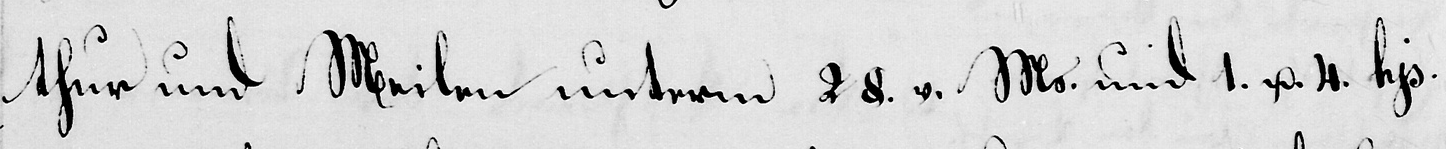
thur und Meilen unterm 28. v. Ms. und 1. u. 4. hjs.
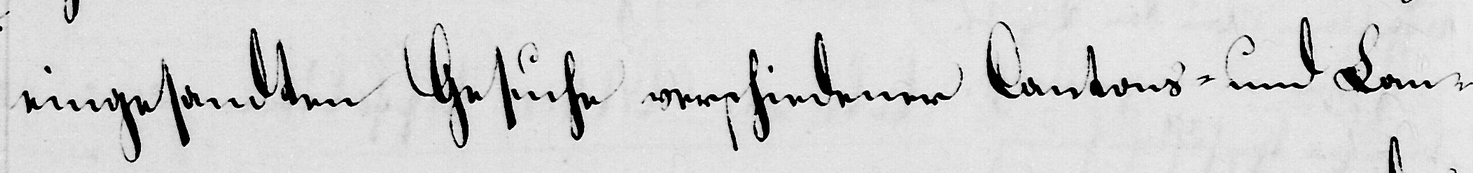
eingesandten Gesuche verschiedener Cantons- und Lan-
